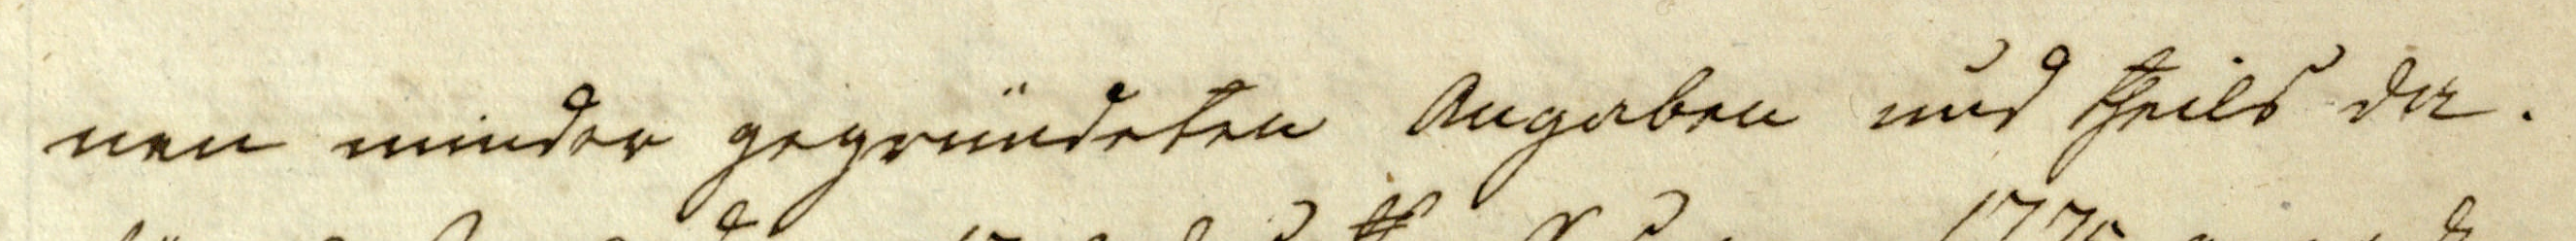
nen minder begründeten Angaben und theils da¬
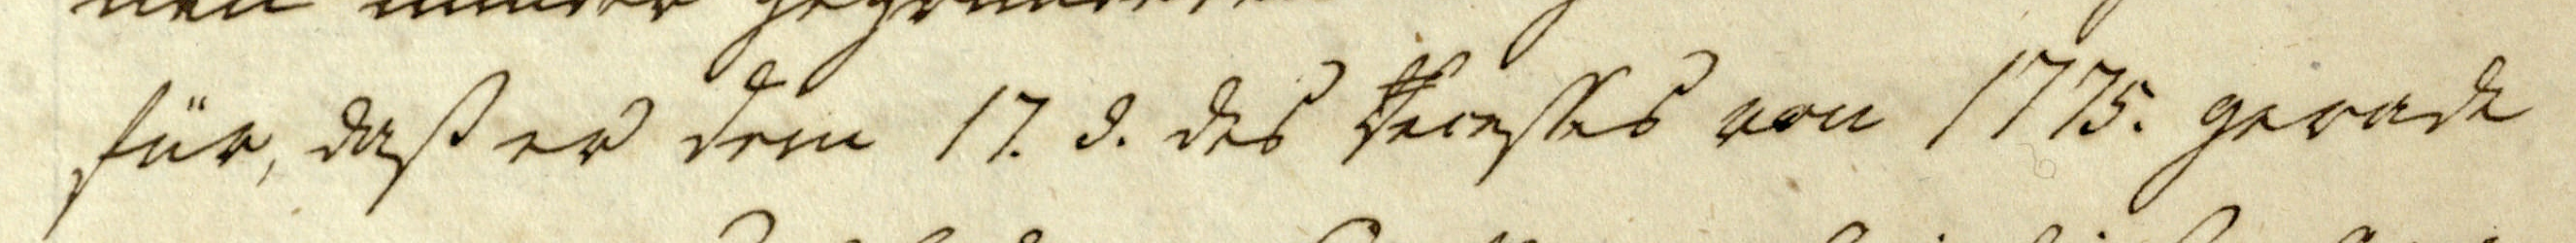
für, daß er dem 17. d. des Recesses von 1775. gerade
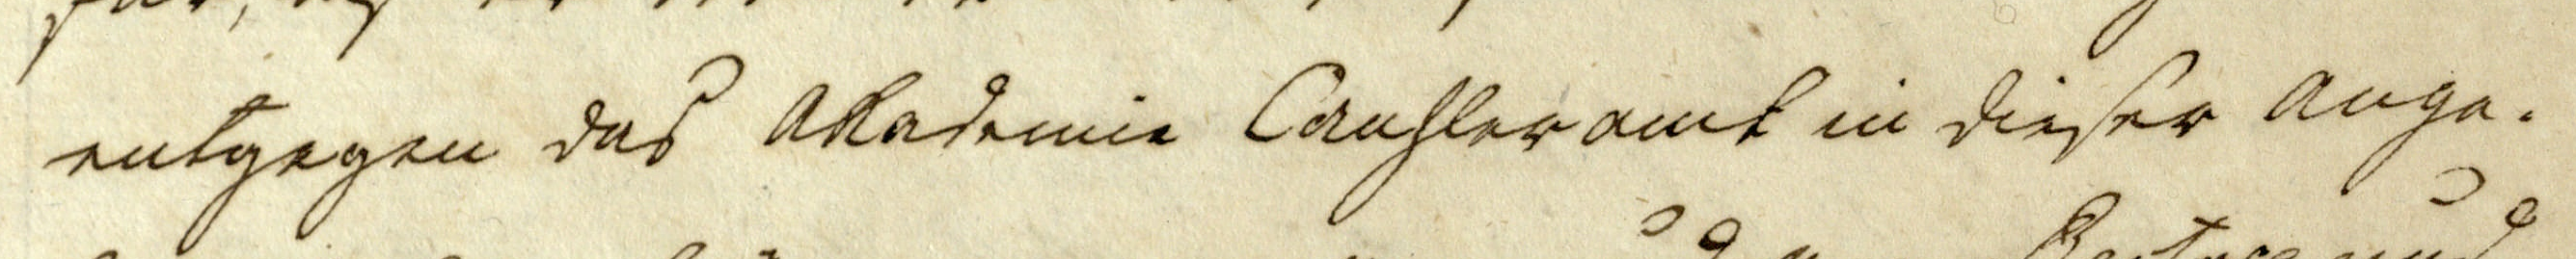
entgegen das Akademie Canzleramt in dieser Ange¬
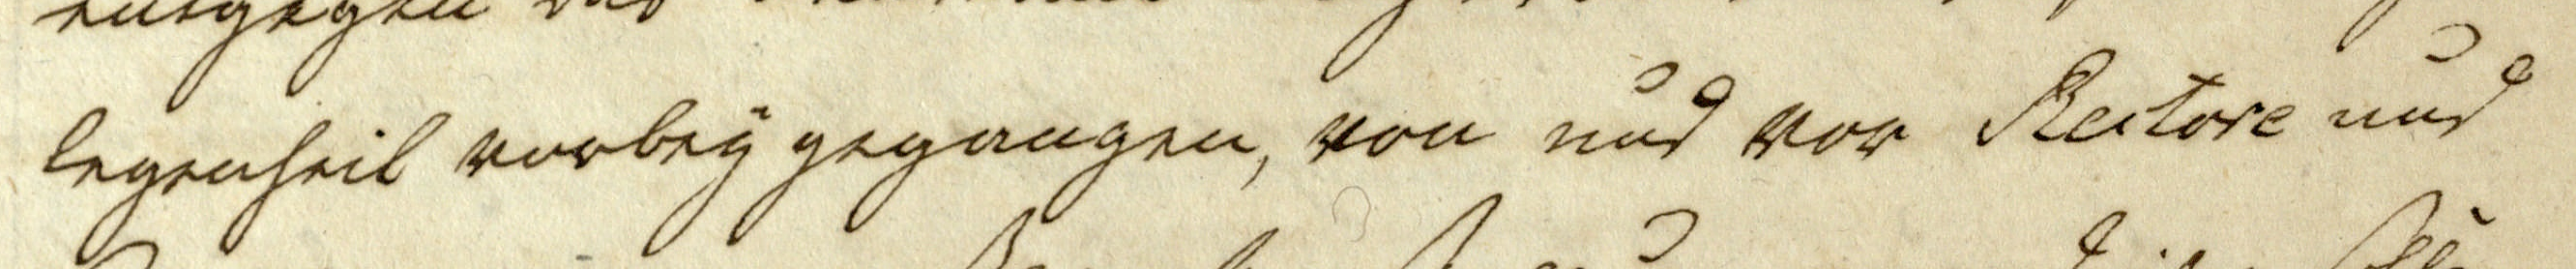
legenheit vorbeÿ gegangen, von und vor Rectore und
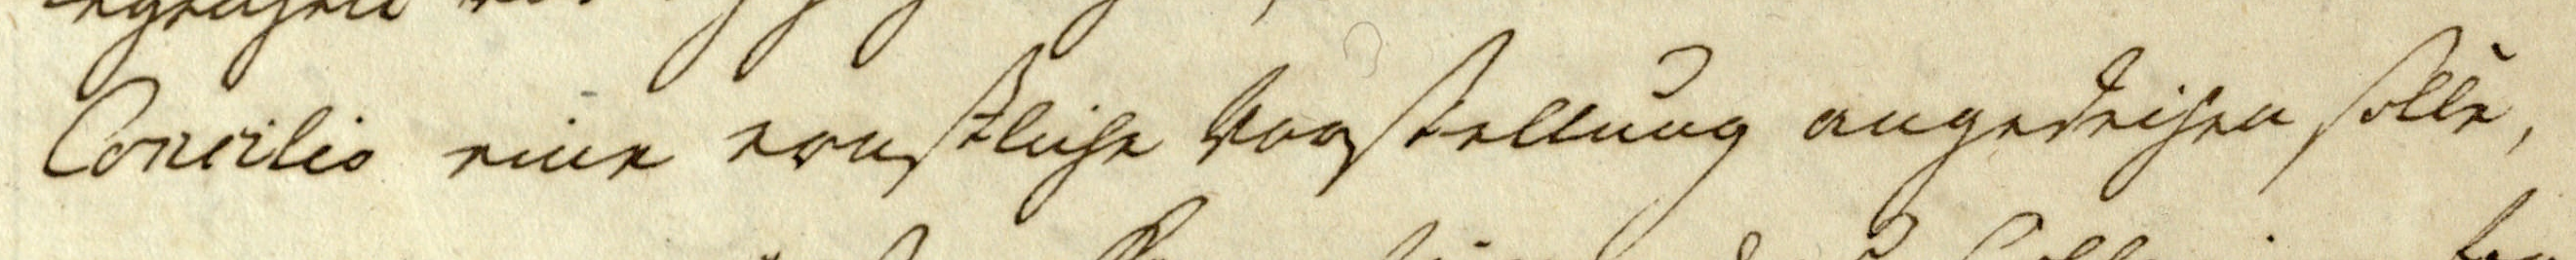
Concilio eine ernstliche Vorstellung angedeihen solle,
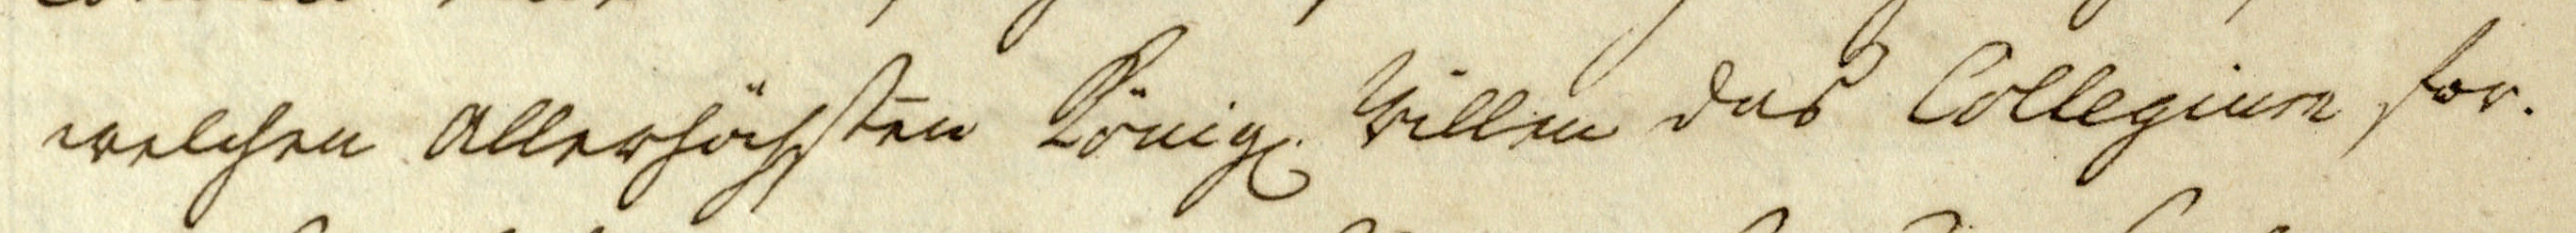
welchen allerhöchsten Königl. Willen das Collegium for¬
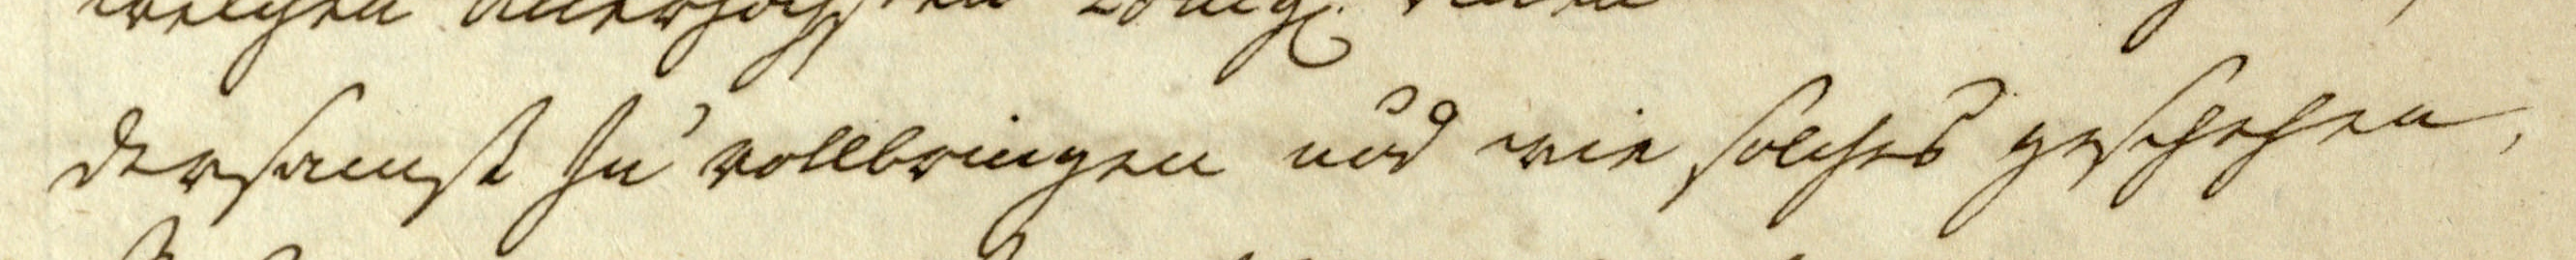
dersamst zu vollbringen und wie solches geschehen,
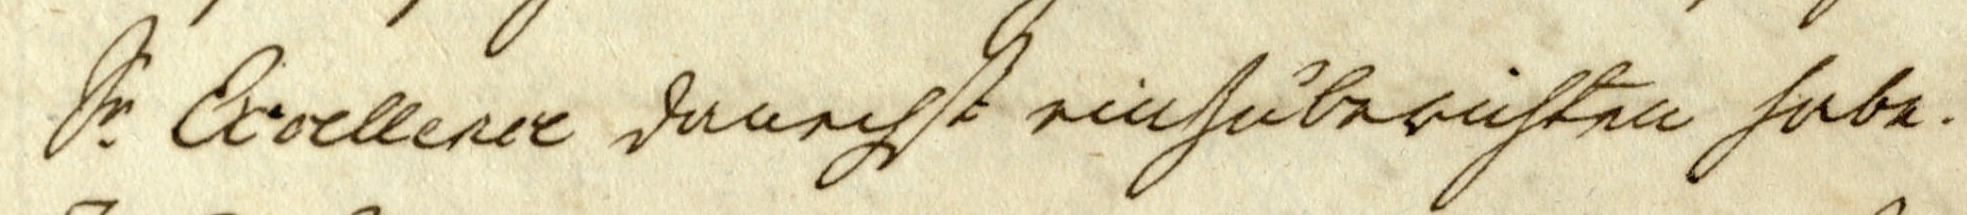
Sr. Excellence danechst einzuberichten habe.
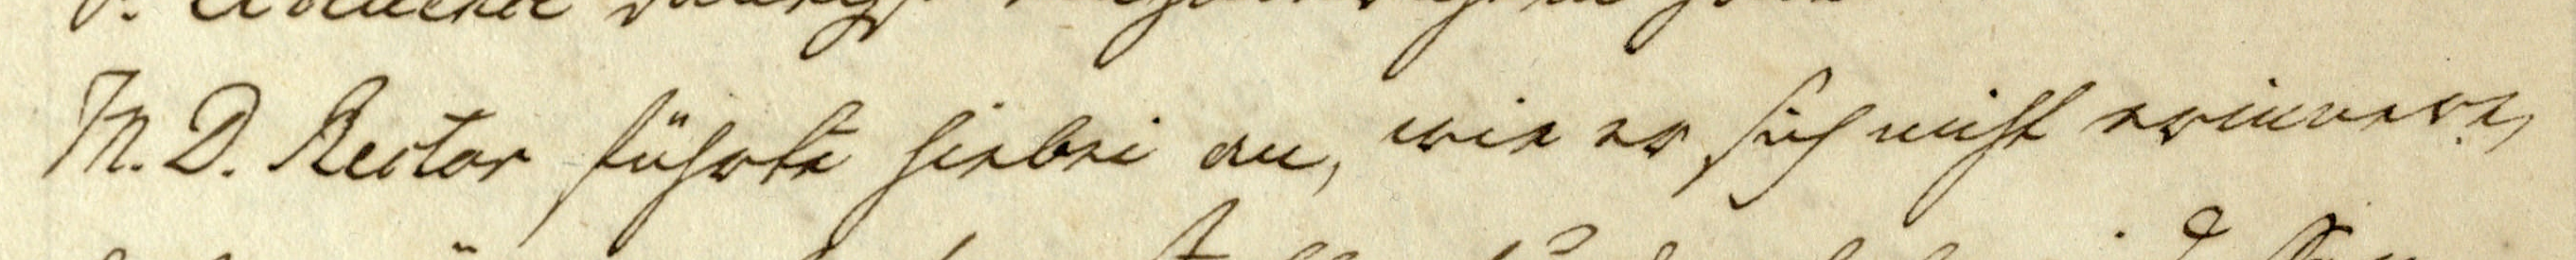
M. D. Rector führte hiebei an, wie er sich nicht erinnert,
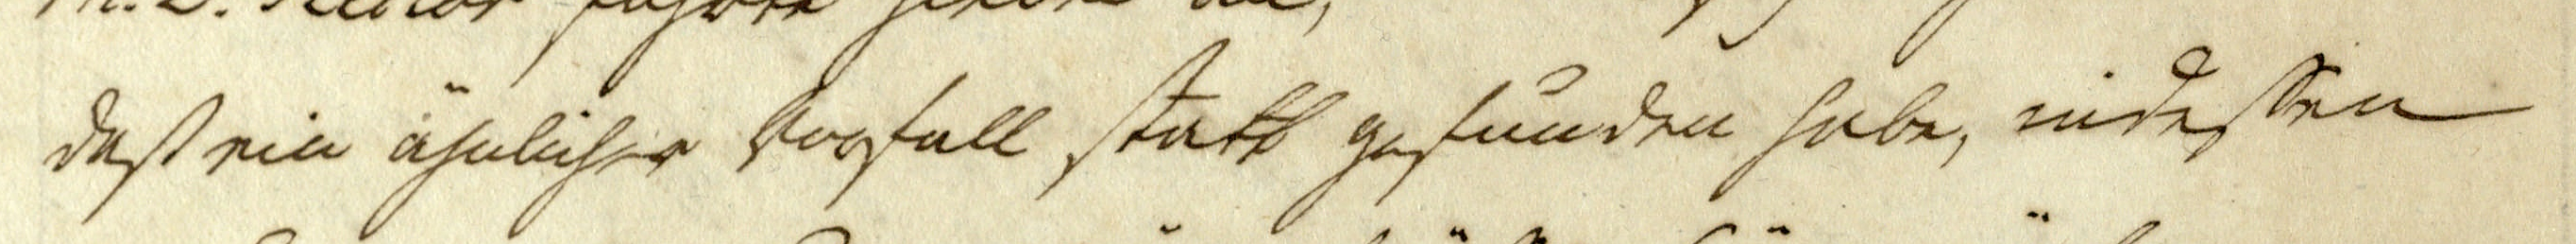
daß ein ähnlicher Vorfall statt gefunden habe, indessen
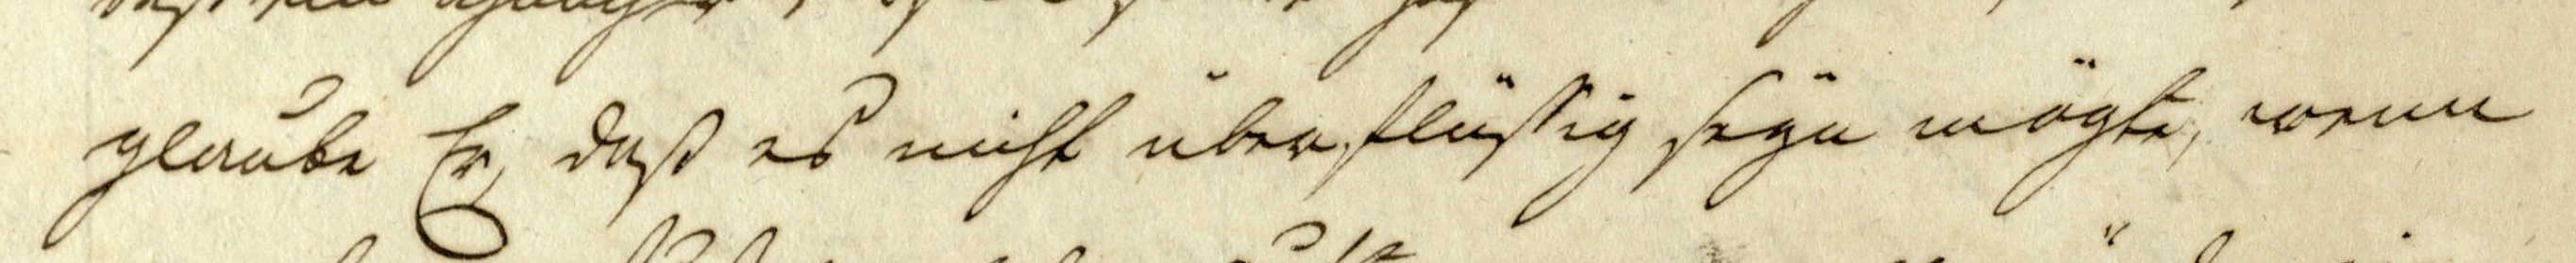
glaube Er, daß es nicht überflüssig seÿn mögte, wenn
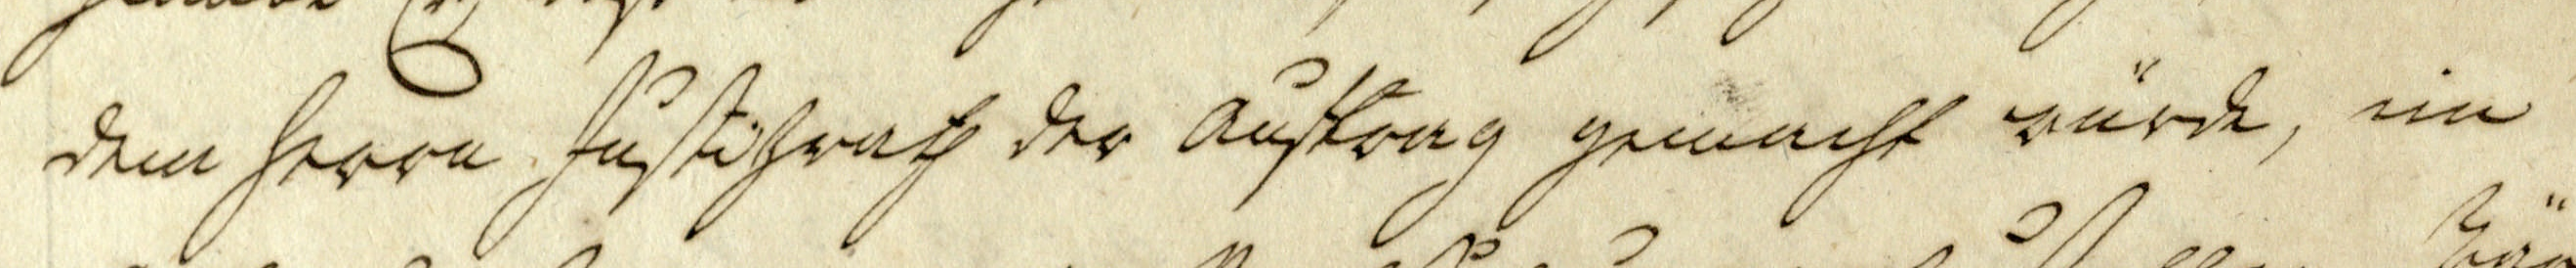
dem herrn Justizrath der Auftrag gemacht würde, im
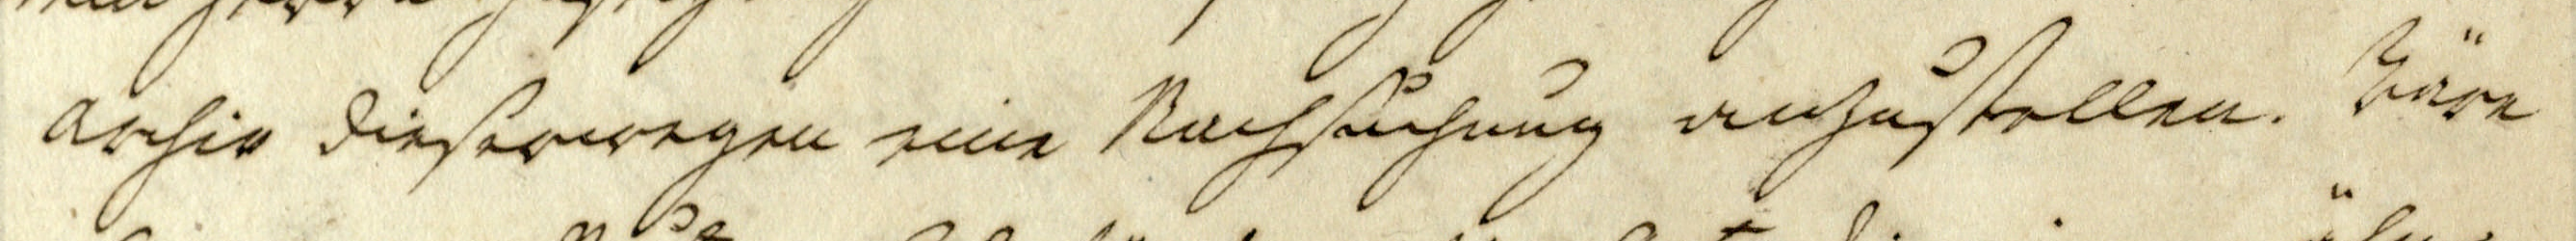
Archiv dieserwegen eine Nachsuchung anzustellen. Wäre
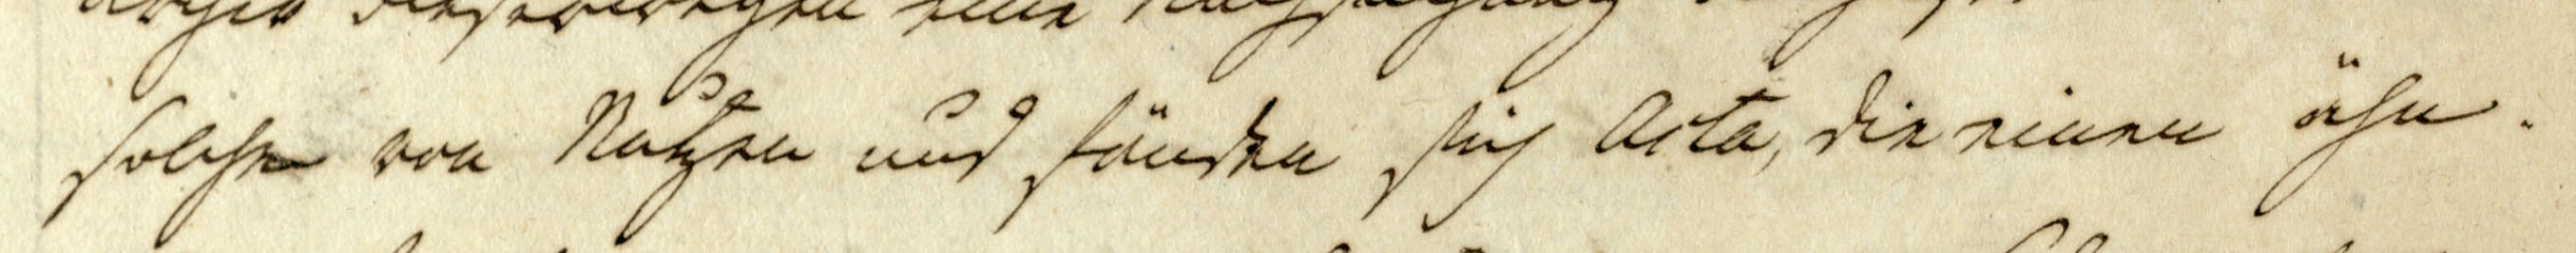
solche von Nutzen und fänden sich Acta, die einen ähn¬
